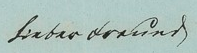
Lieber Freund
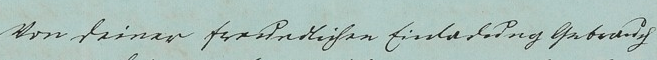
Von deiner freundlichen Einladung Gebrauch
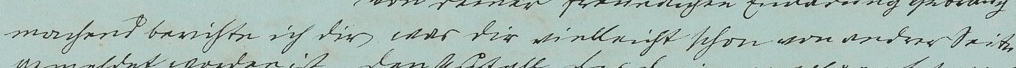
machend berichte ich dir, was dir vielleicht schon von andrer Seite
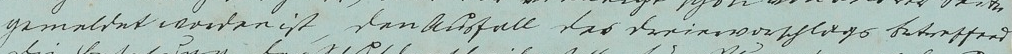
gemeldet worden ist, den Ausfall des Dreiervorschlags betreffend
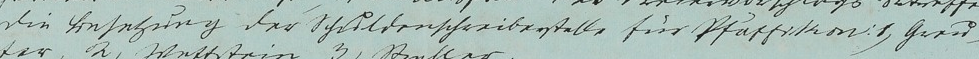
die Besetzung der Schuldenschreiberstelle für Pfäffikon: 1) Greu-
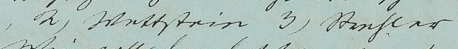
2) Wettstein 3) Strehler.
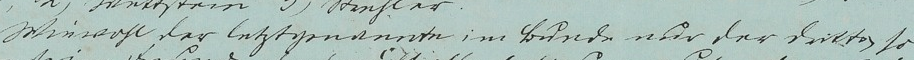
Wiewohl der letztgenannte im Bunde nur der Dritte, so
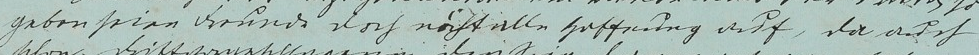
geben seine Freunde doch nicht alle Hoffnung auf, da auch
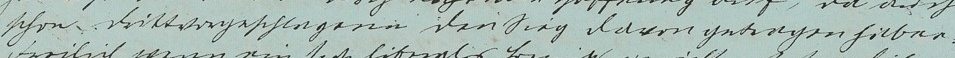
schon drittvorgeschlagene den Sieg davon getragen haben.
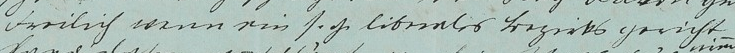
Freilich wenn ein s.g. liberales Bezirksgericht
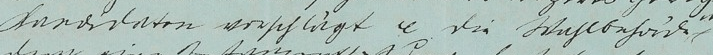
Kandidaten vorschlägt & die Wahlbehörde
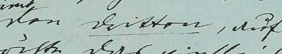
den Dritten, auf
